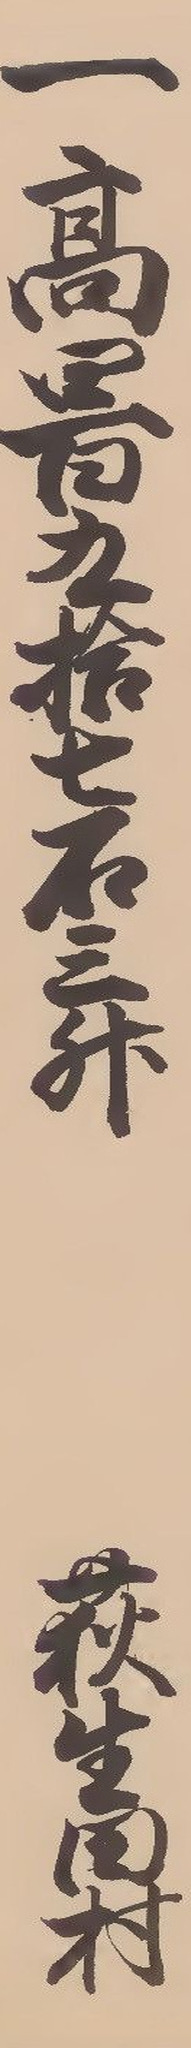一高四百九拾七石三升荻生田村

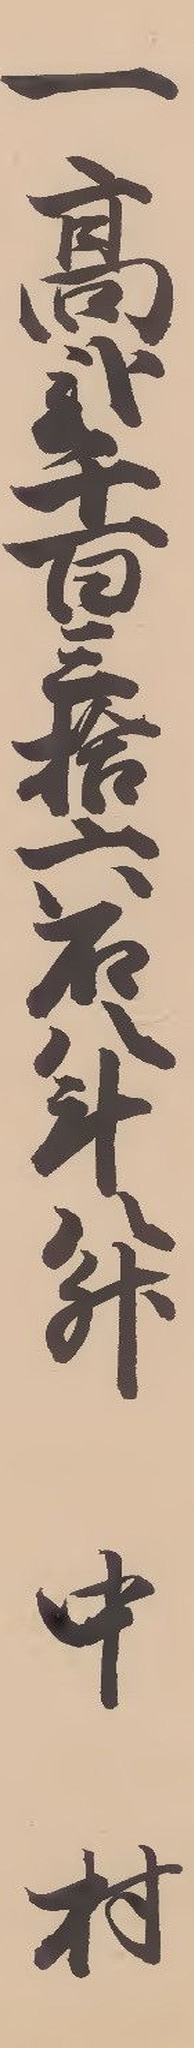一高弐千百三拾六石八斗八升中村
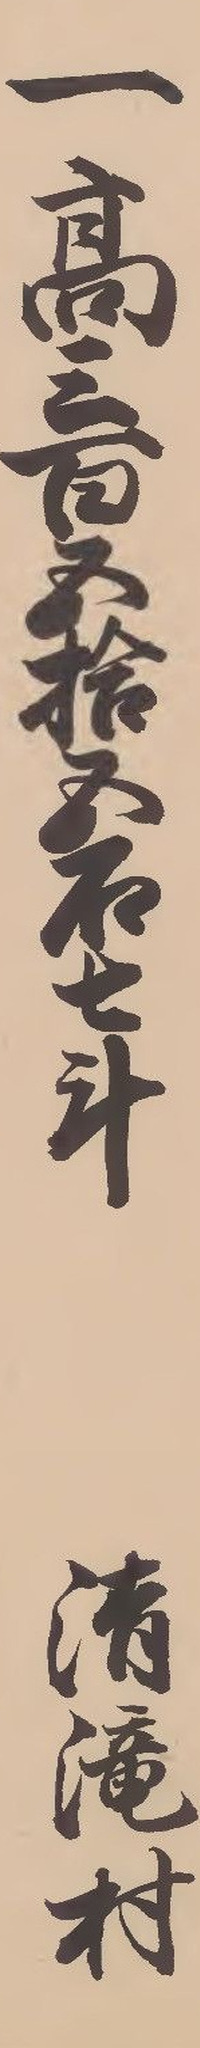一高三百五拾五石七斗清滝村
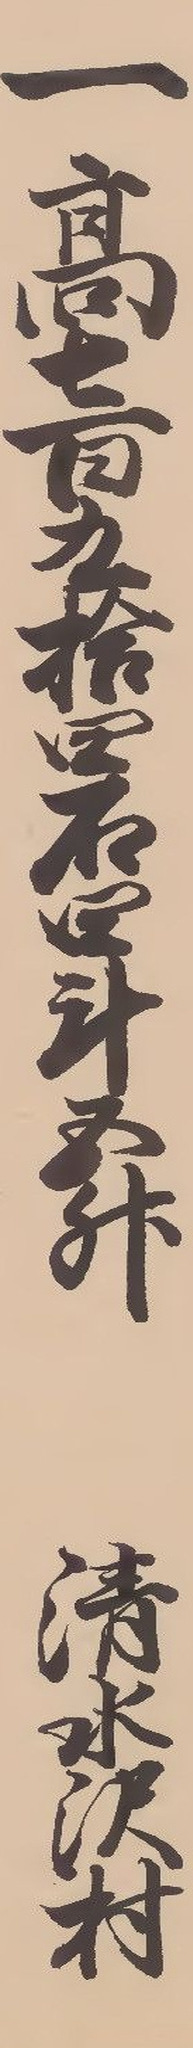一高七百九拾四石四斗五升清水沢村
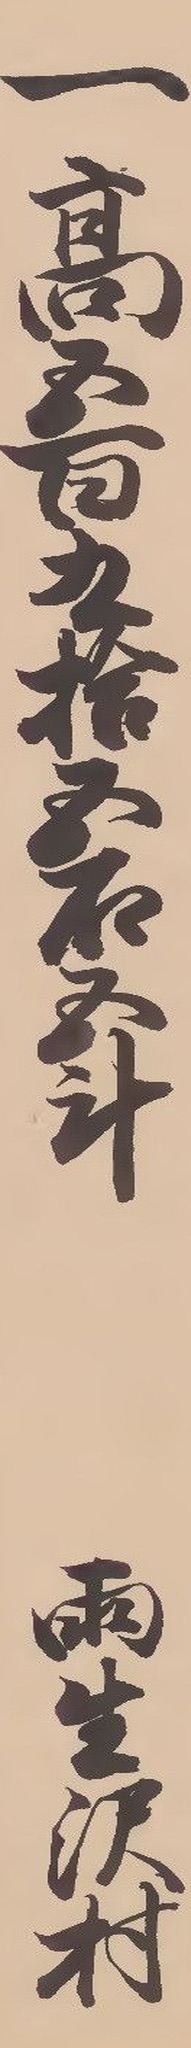一高五百九拾五石五斗雨生沢村
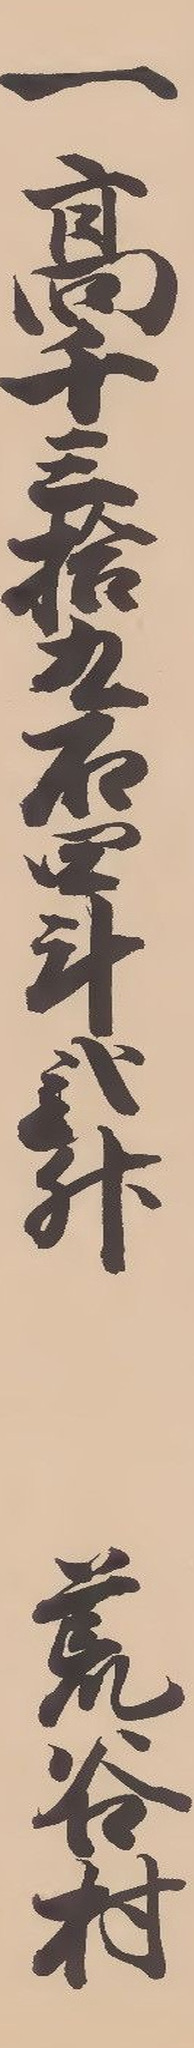一高千三拾九石四斗弐升荒谷村
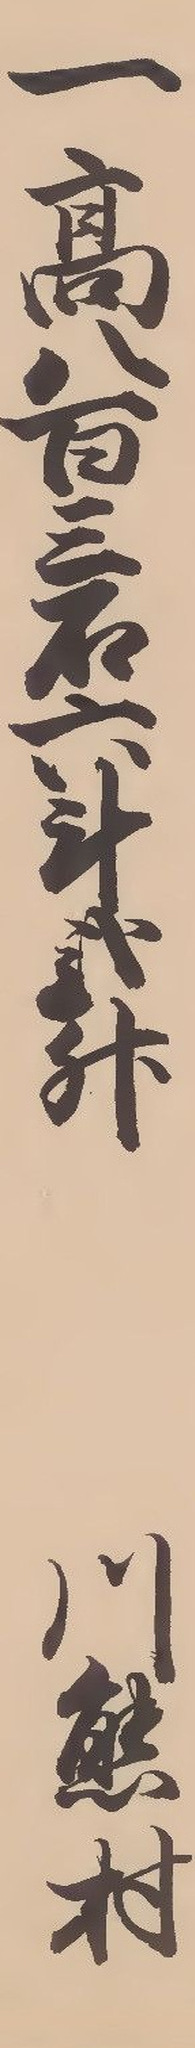一高八百三石六斗弐升川熊村
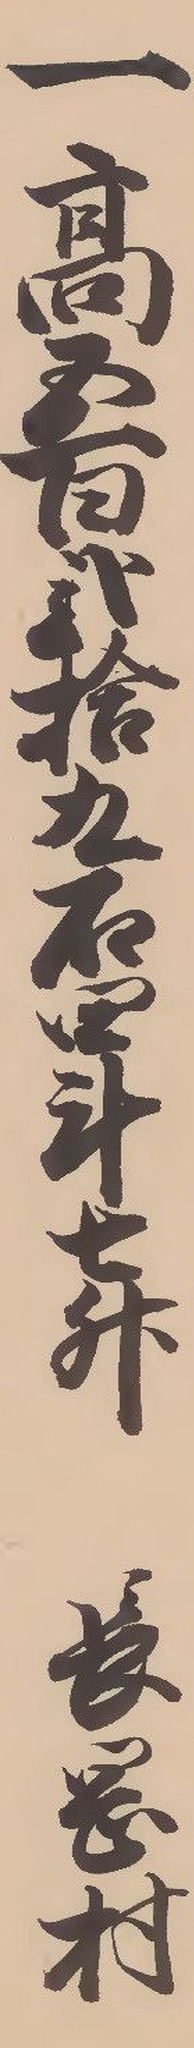一高五百弐拾九石四斗七升長岡村
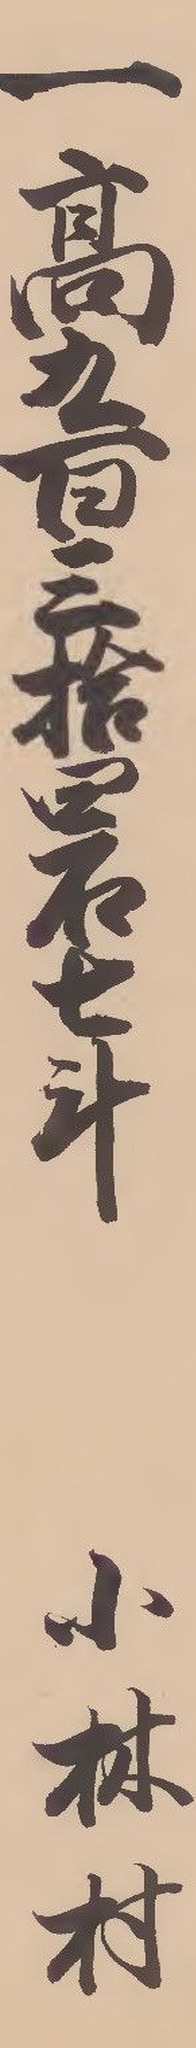一高九百三拾四石七斗小林村

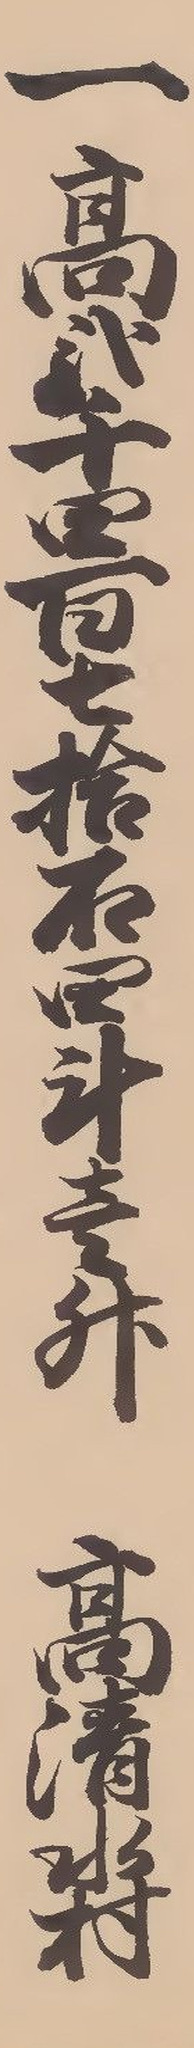一高弐千四百七拾石四斗壱升高清水村
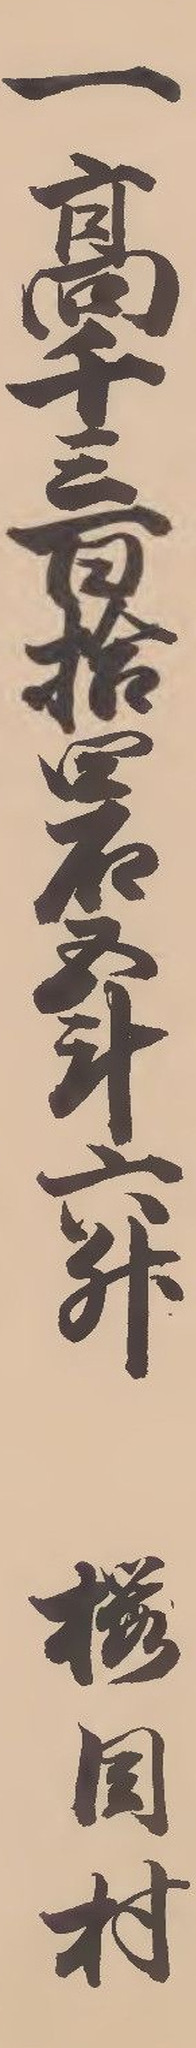一高千三百拾四石五斗六升桜目村
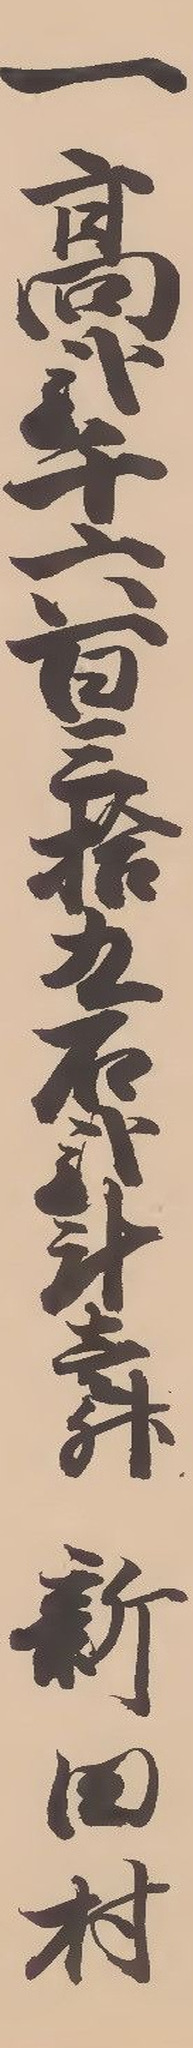一高弐千六百三拾九石弐斗壱升新田村
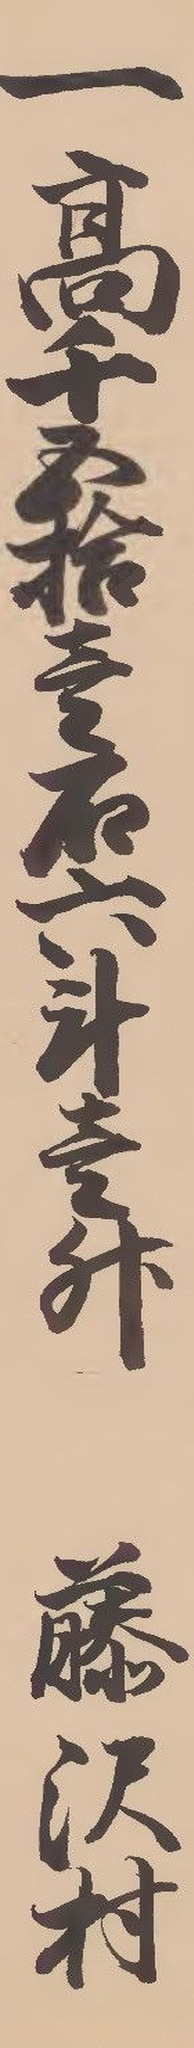一高千五拾壱石六斗壱升藤沢村
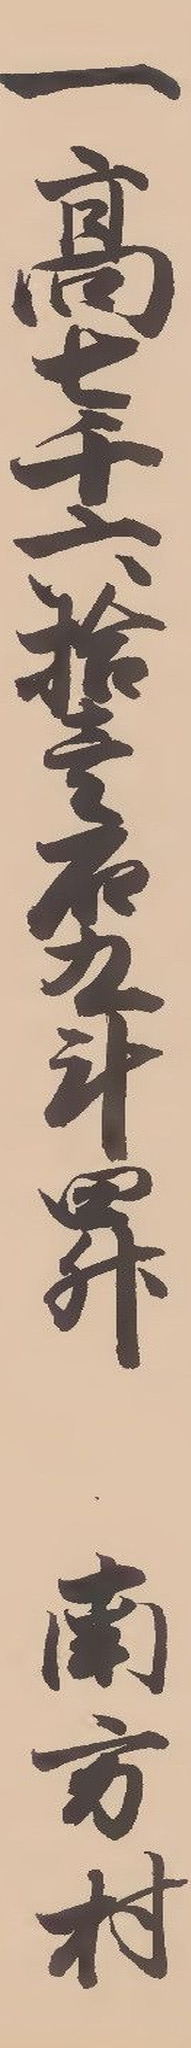一高七千六拾壱石九斗四升南方村
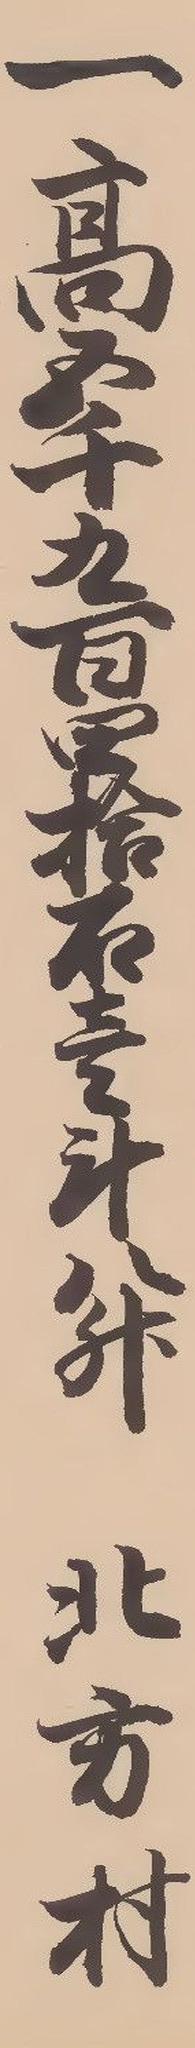一高五千九百四拾石壱斗八升北方村
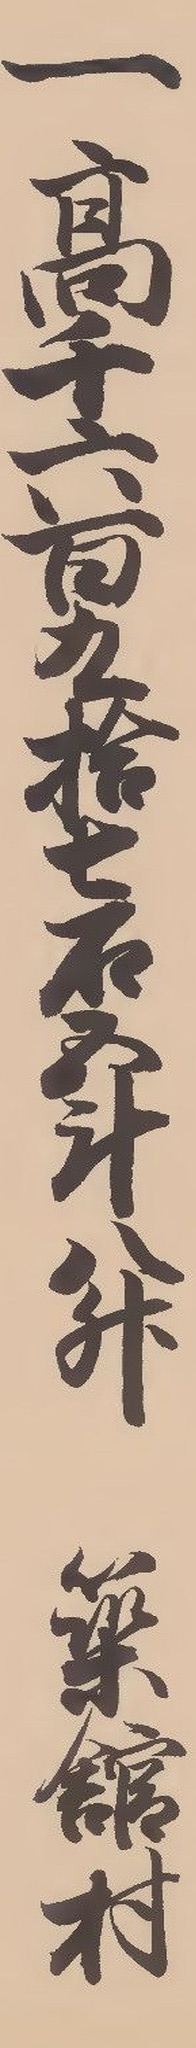一高千六百九拾七石五斗八升築館村
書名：陸奥国郷帳　５
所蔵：国立公文書館 National Archives of Japan
